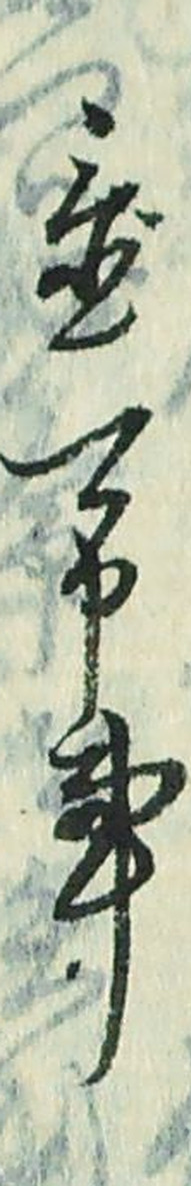置可申事
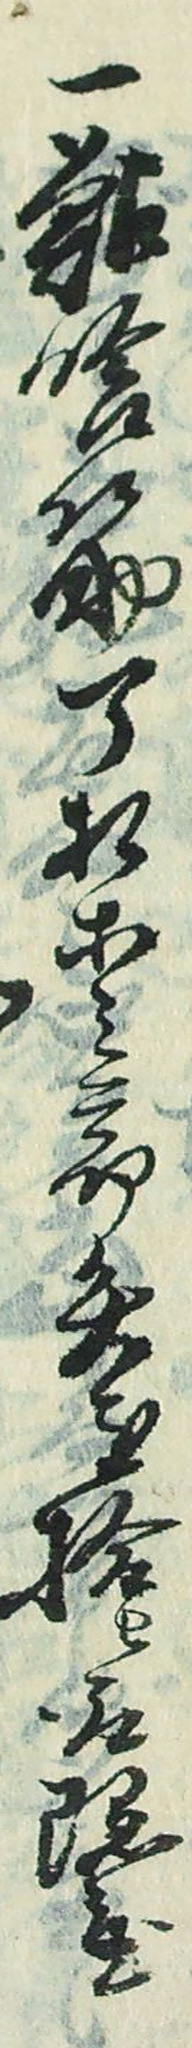一鮎喰筋了打等之節矢を拾ヒ取隠置
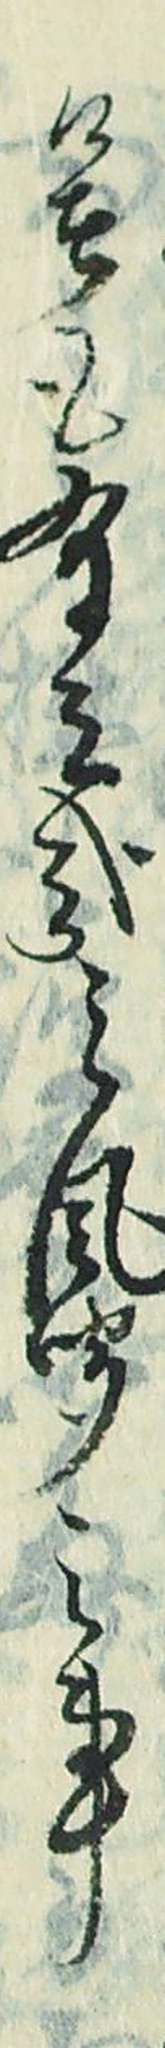候者も有之哉之風聞之事
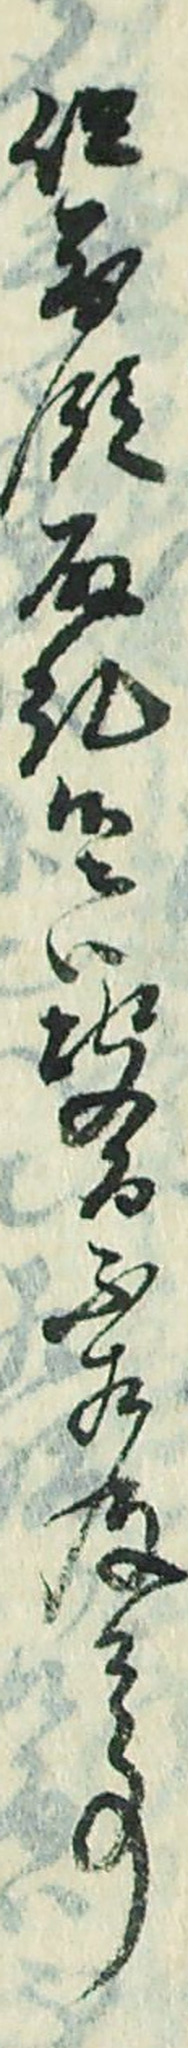但別段取糺候ニハ決而不相及候事

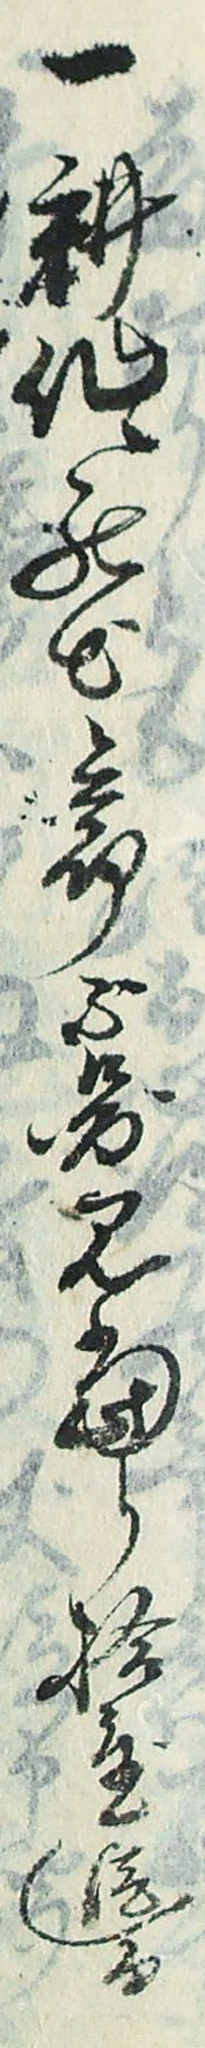一耕作へ罷出候節不圖見當り拾置追而
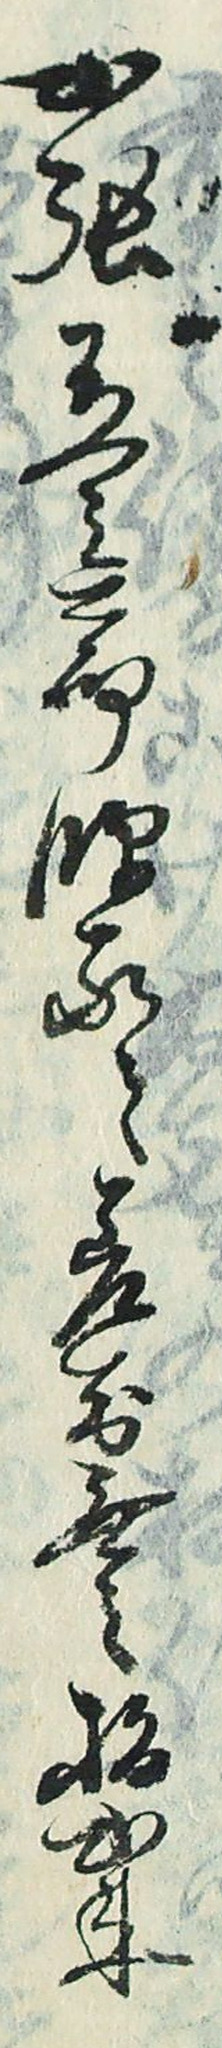出張有之節彼家々へ差別無之指出来
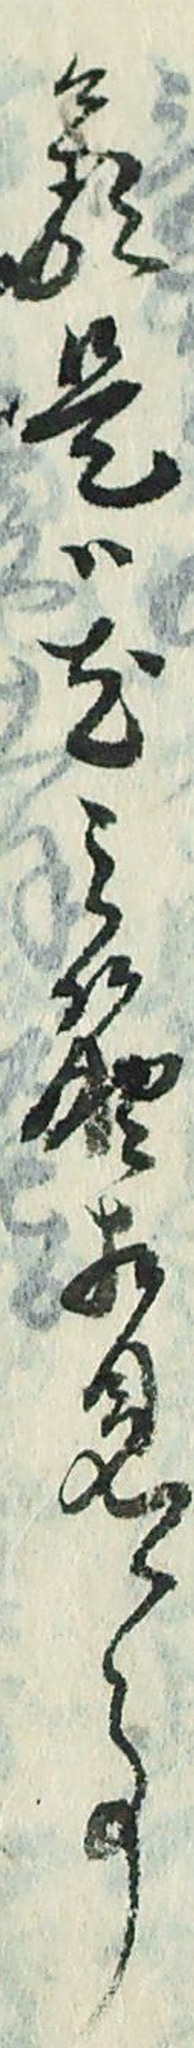候類是ハ尤之筋ニ相見候事
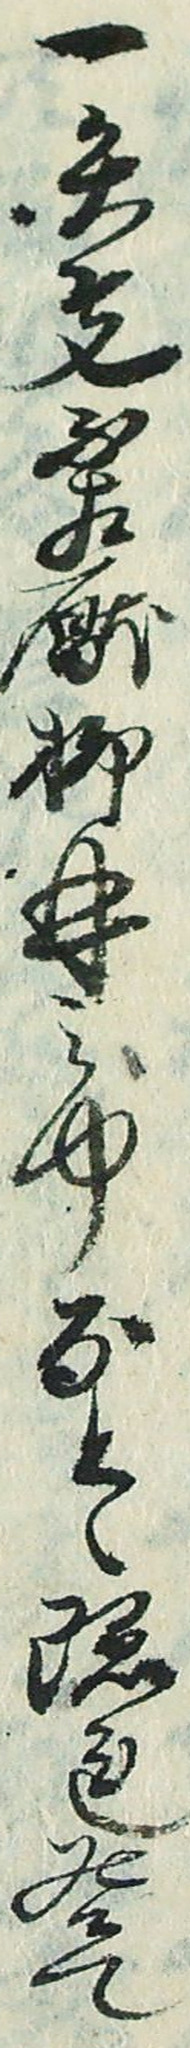一矢先不相厭柳林之中なとへ隠れ居候て
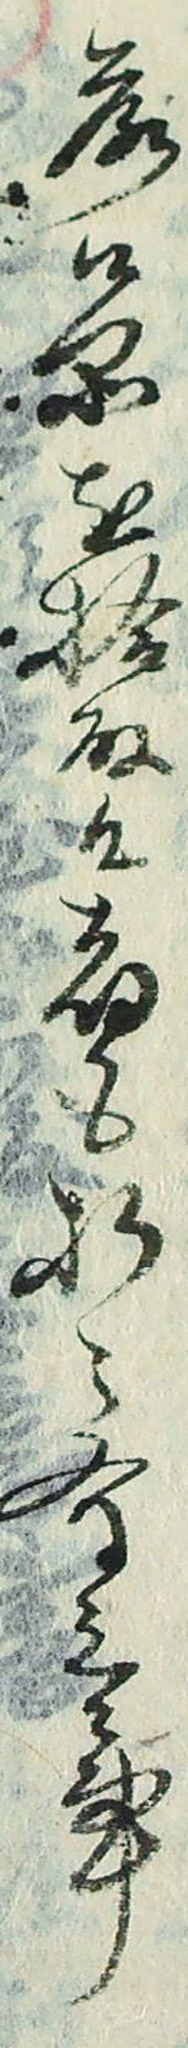落候品を拾取候者も折々有之候事
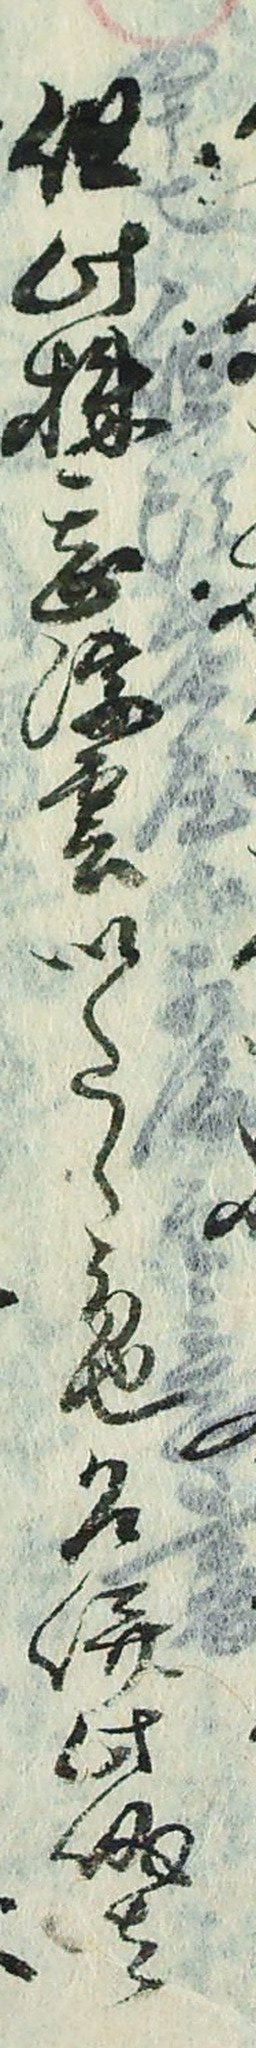但此株甚浮雲いたし方也乍併此儀者
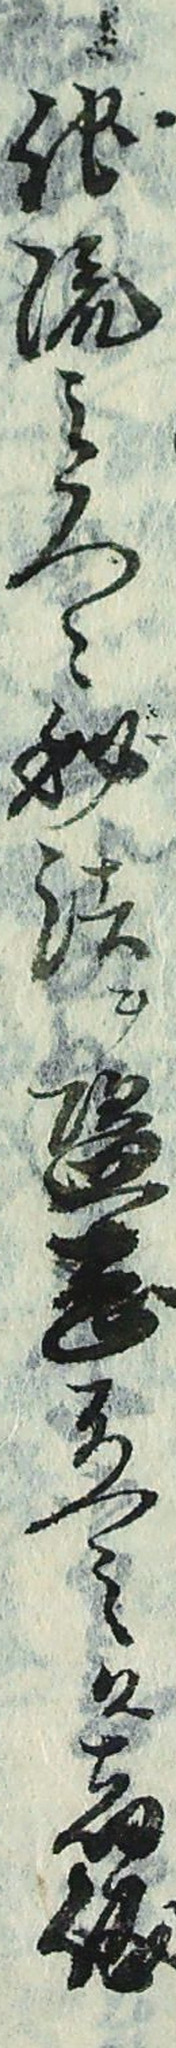他流之人々秘法ヲ盗甚志有之候者儀
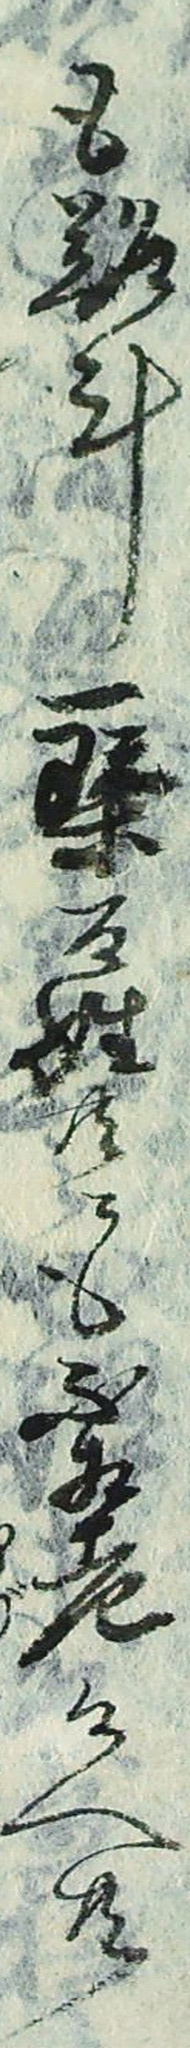も難斗一概百姓共ニも不相考候へ共
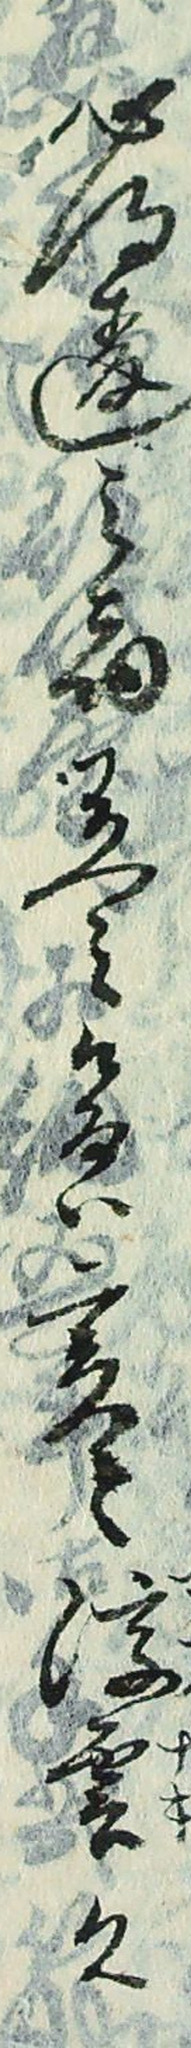心得違之者有之候而ハ実ニ浮雲候
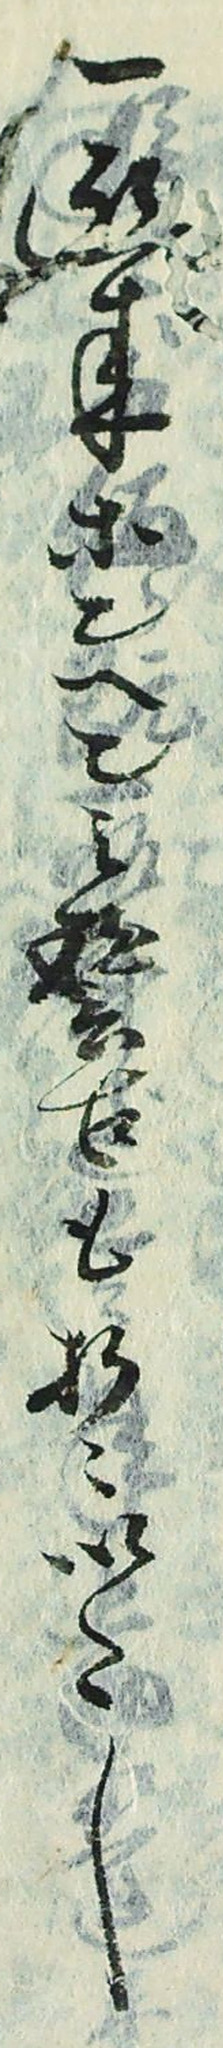一近来ホンヘン之稽古も折々いたし
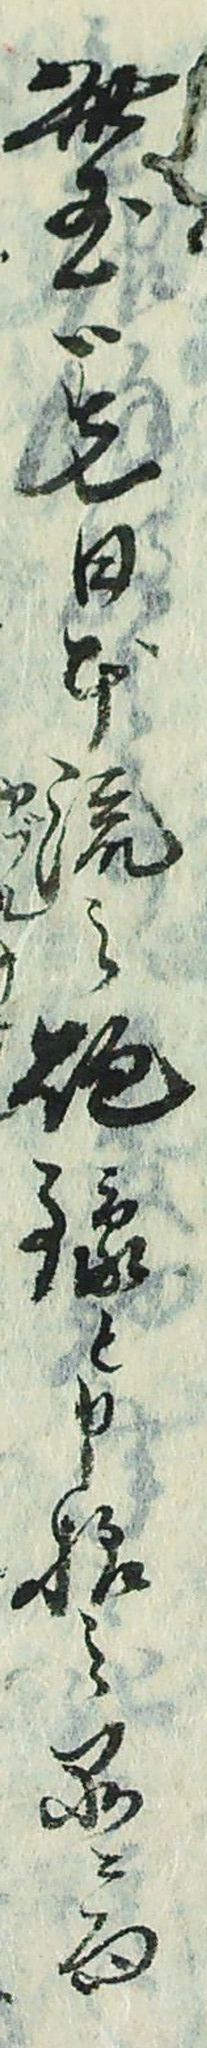此玉ハ先日本流之炮録と申様之品ニ向
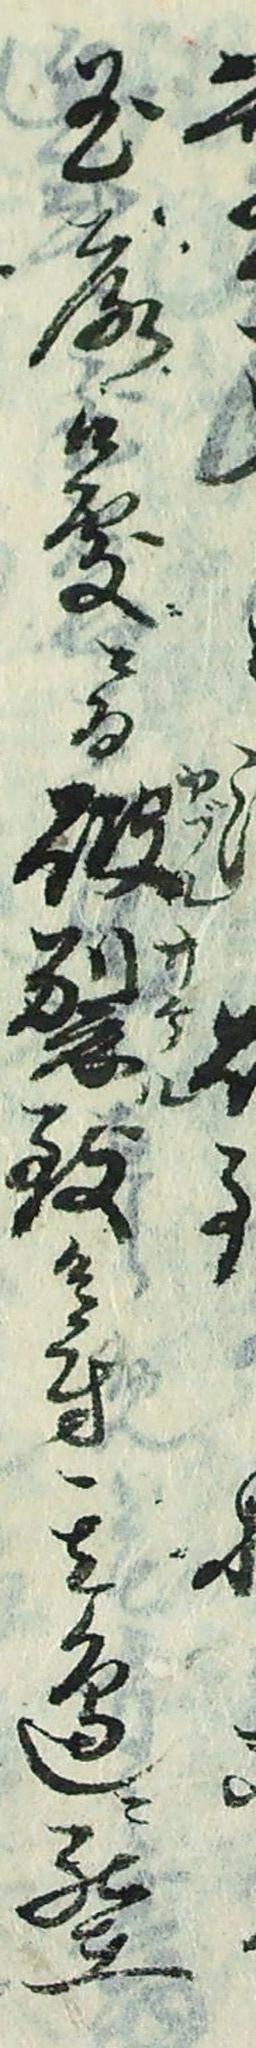玉落候處ニ而破裂致候ニ付其邊ニ罷在
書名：諸御趣意書并御下知向之写
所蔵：鳴門教育大学 Naruto University of Education
